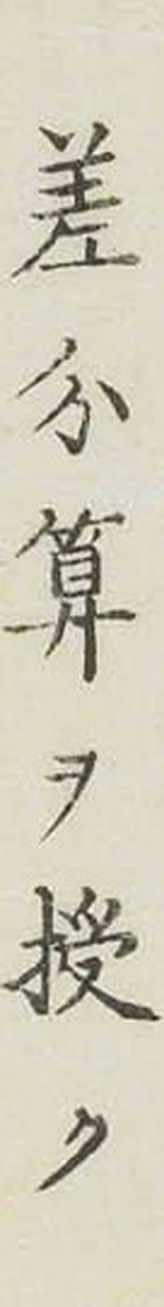差分算ヲ授ク
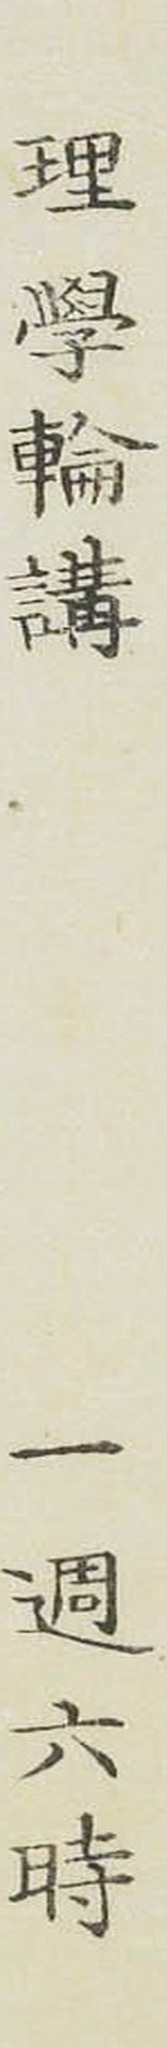理学輪講一週六時
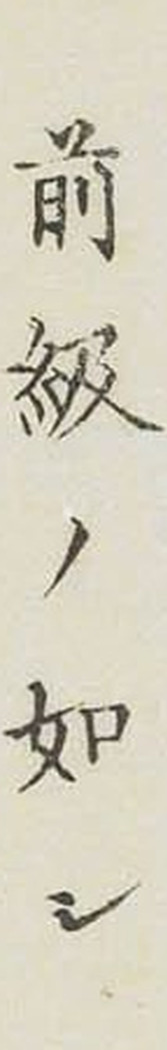前級ノ如シ
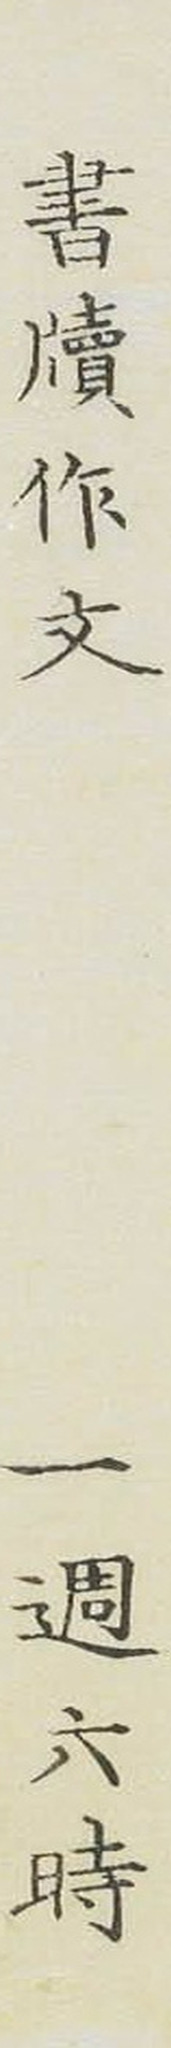書牘作文一週六時
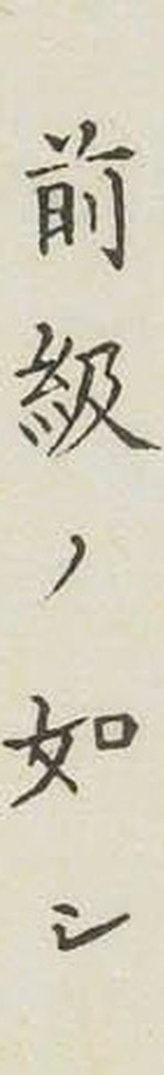前級ノ如シ
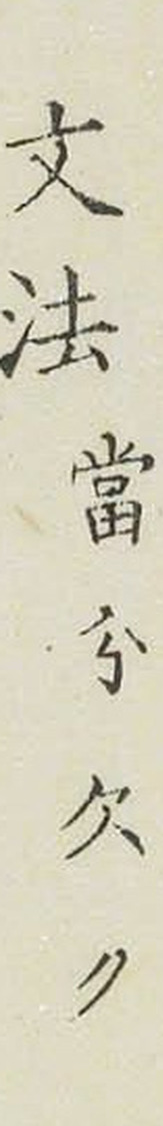文法当分欠ク
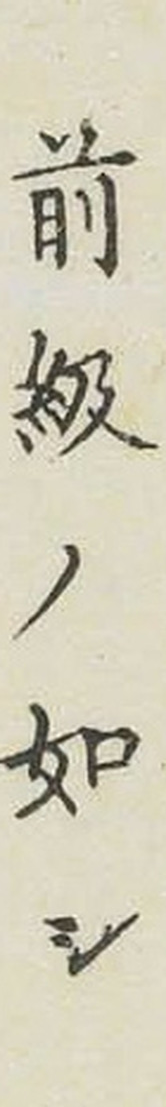前級ノ如シ
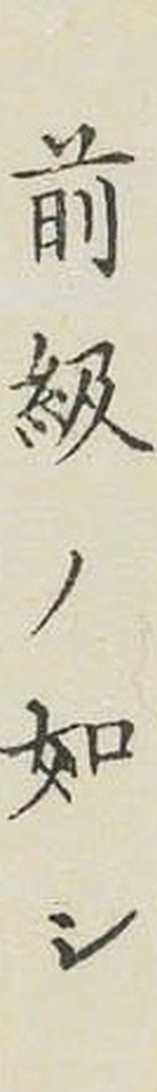前級ノ如シ
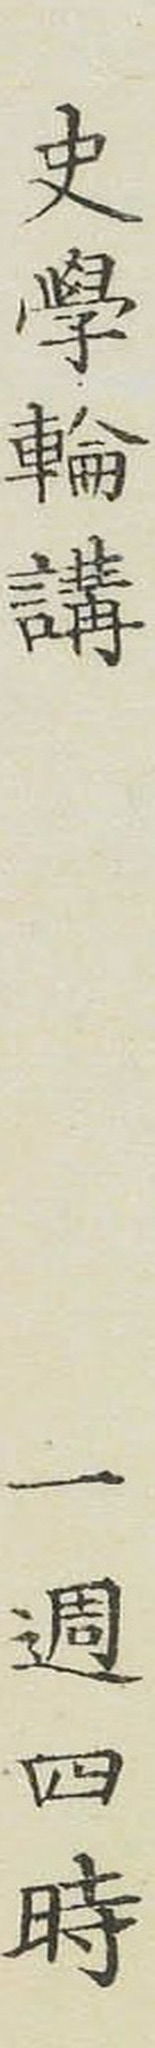史学輪講一週四時
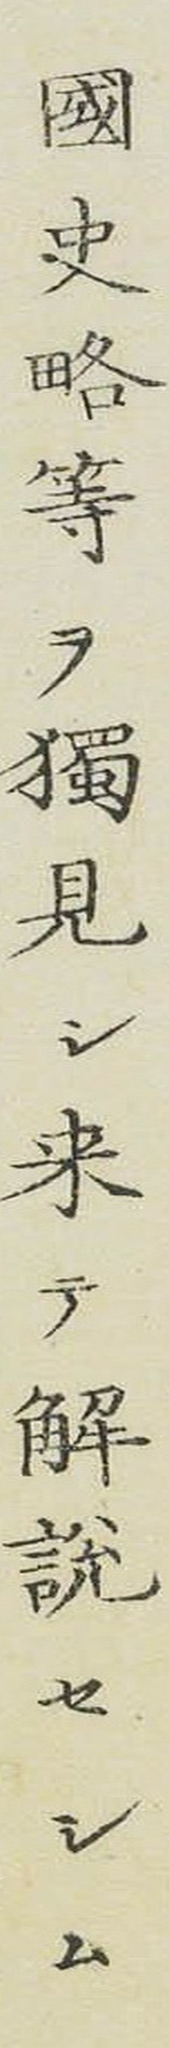国史略等ヲ独見シ来テ解説セシム
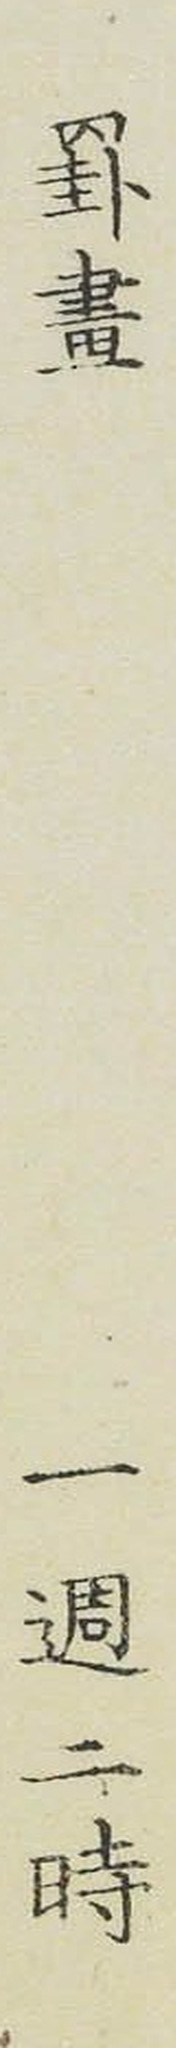罫書一週二時
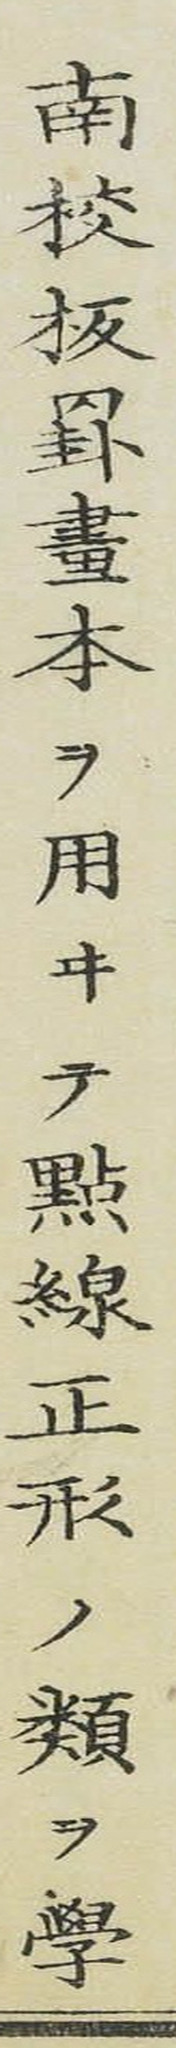南校板罫書本ヲ用ヰテ点線正形ノ類ヲ学
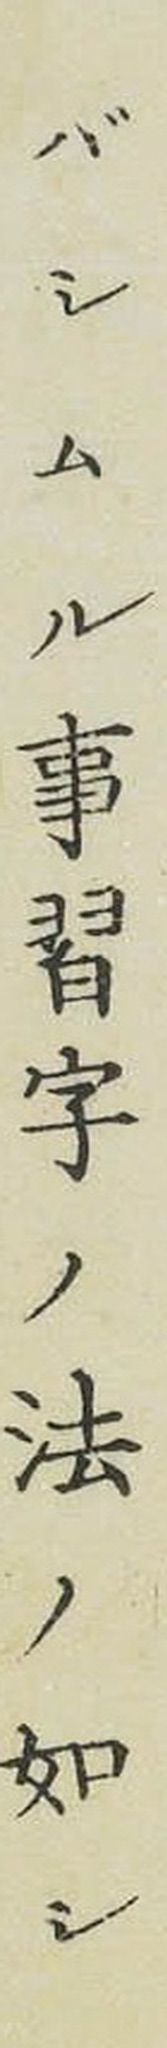バシムル事習字ノ法ノ如シ

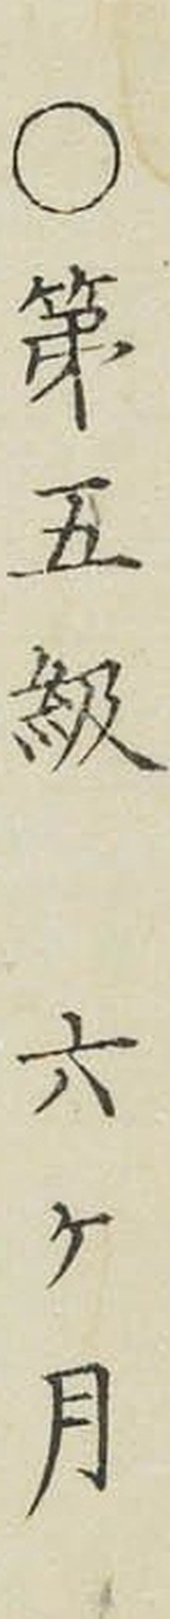○第五級六ケ月
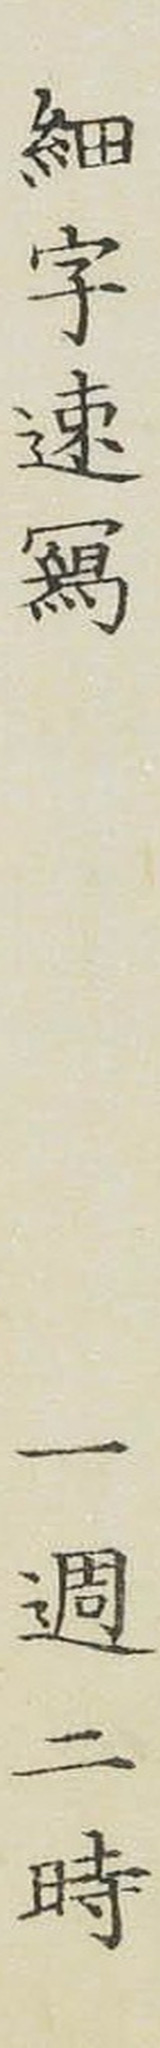細字速写一週二時
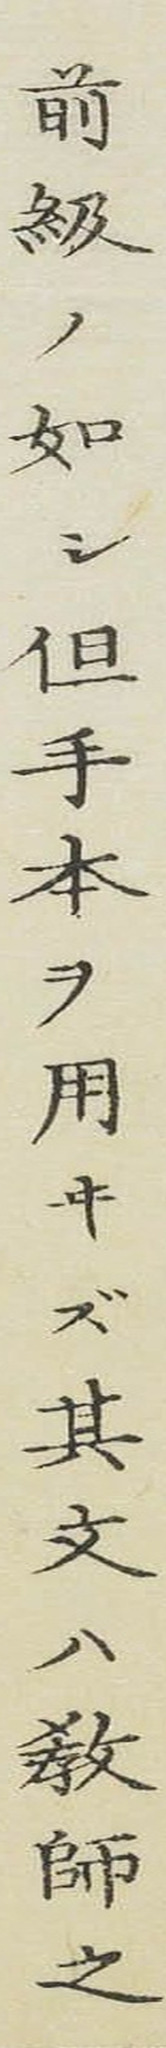前級ノ如シ但手本ヲ用ヰズ其文ハ教師之
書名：小学教則
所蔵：東京学芸大学教育コンテンツアーカイブ
